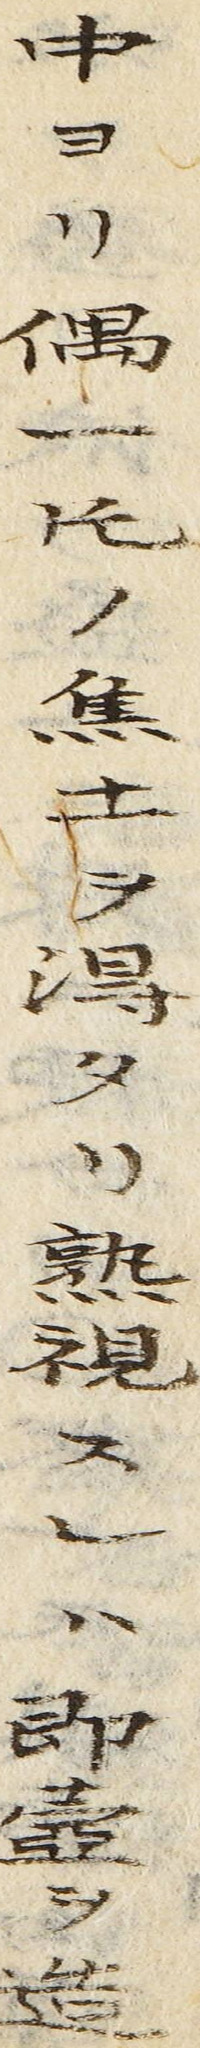中ヨリ偶一片ノ焦土ヲ得タリ熟視スレハ即壺ヲ造
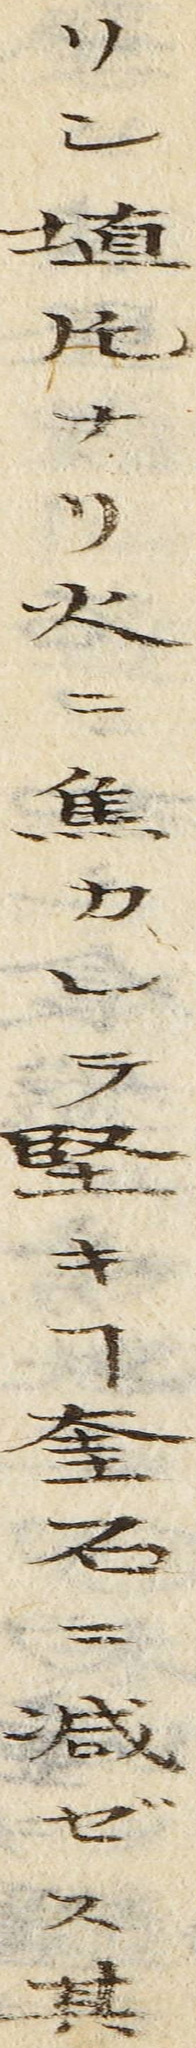リシ埴片ナリ火ニ焦カレテ堅キコト奎石ニ減ゼス其
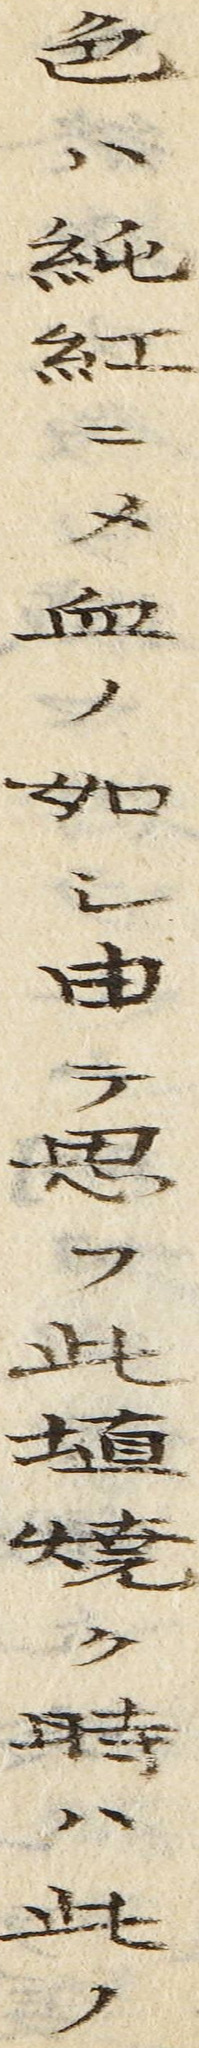色ハ純紅ニシテ血ノ如シ由テ思フ此埴焼ク時ハ此ノ
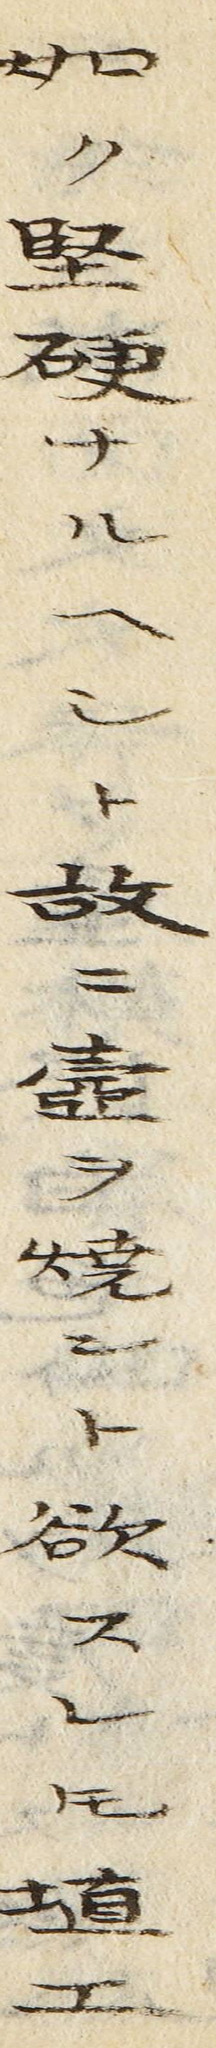如ク堅硬ナルヘシト故ニ壺ヲ焼ント欲スレトモ埴工
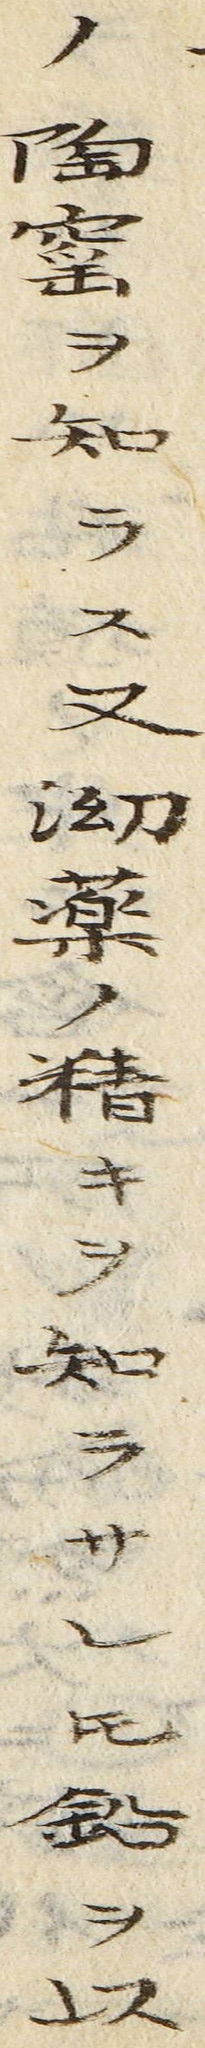ノ陶窰ヲ知ラス又泑薬ノ精キヲ知ラサレトモ鉛ヲ以
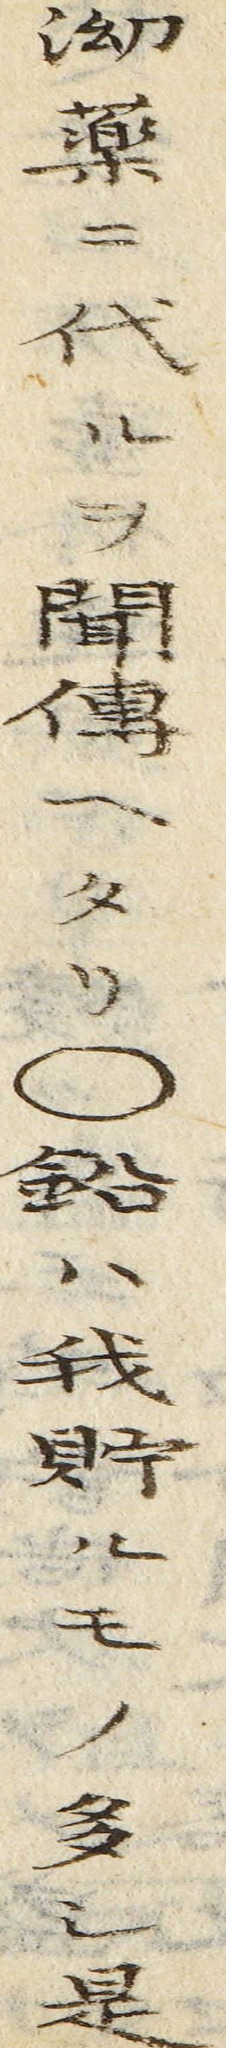泑薬ニ代ルヲ聞伝ヘタリ◯鉛ハ我貯ルモノ多シ是
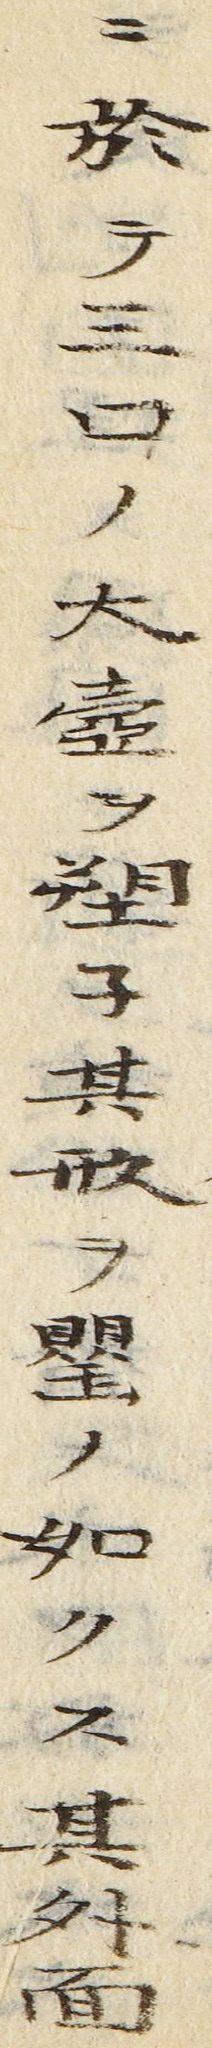ニ於テ三口ノ大壺ヲ塑子其形ヲ罌ノ如クス其外面

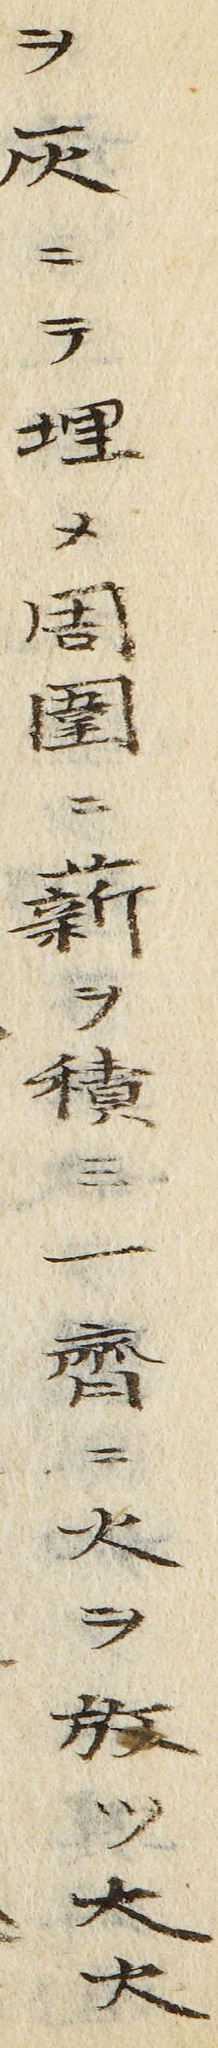ヲ灰ニテ埋メ周囲ニ薪ヲ積ミ一斉ニ火ヲ放ツ大火
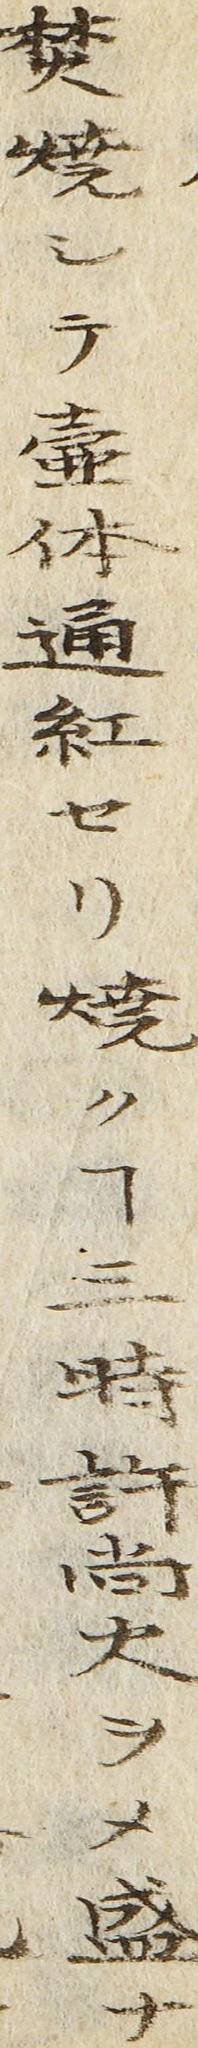焚焼シテ壺体通紅セリ焼クコト三時許尚火ヲシテ盛ナ
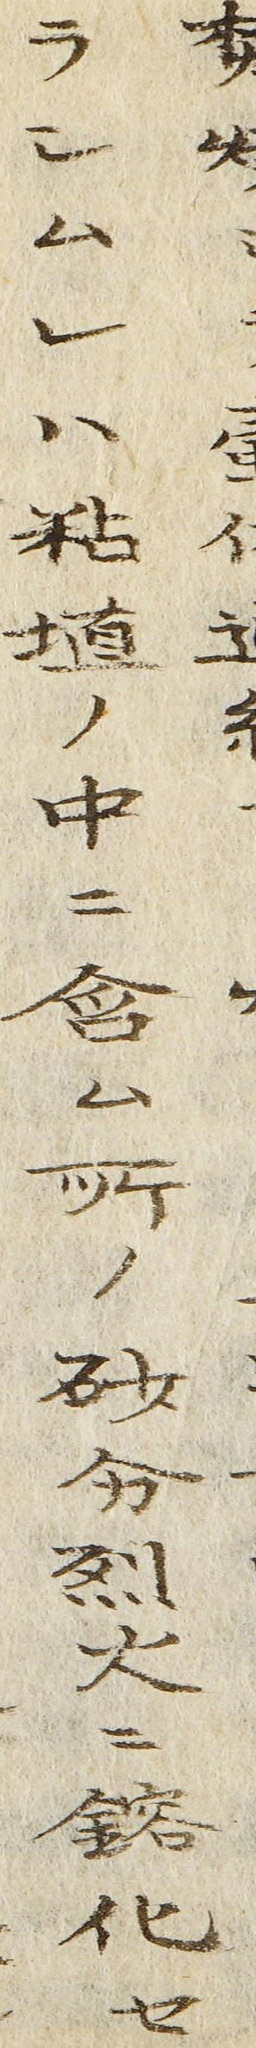ラシムレハ粘埴ノ中ニ含む所ノ砂分烈火ニ鎔化セ
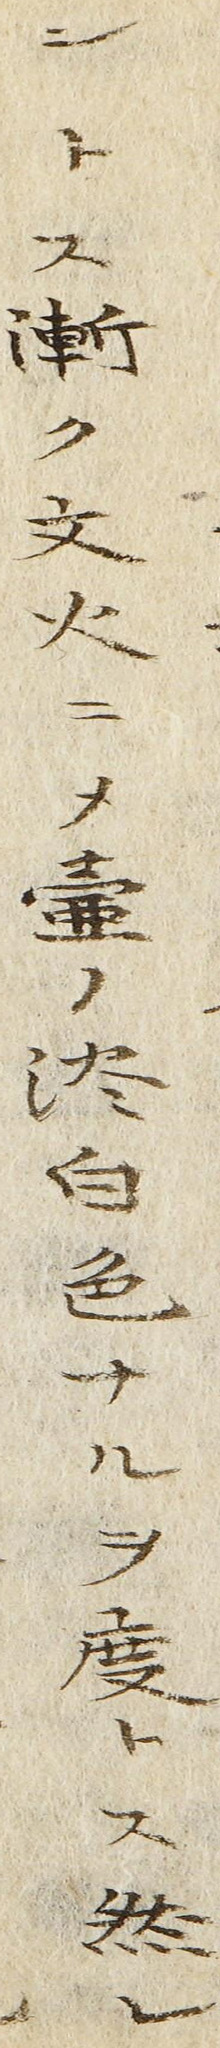ントス漸ク文火ニシテ壺ノ淡白色ナルヲ度トス然レ
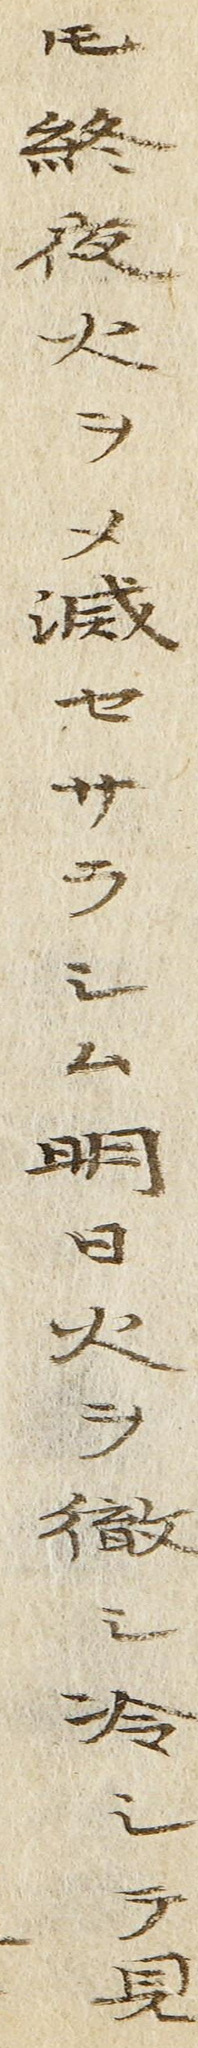トモ終夜火ヲシテ滅セサラシム明日火ヲ徹シ冷シテ見
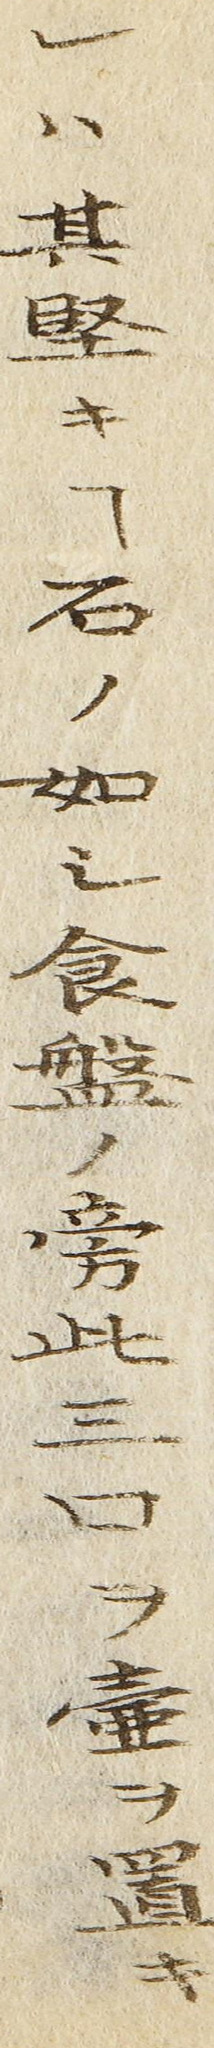レハ其堅キコト石ノ如シ食盤ノ旁此三口ヲ壺ヲ置キ
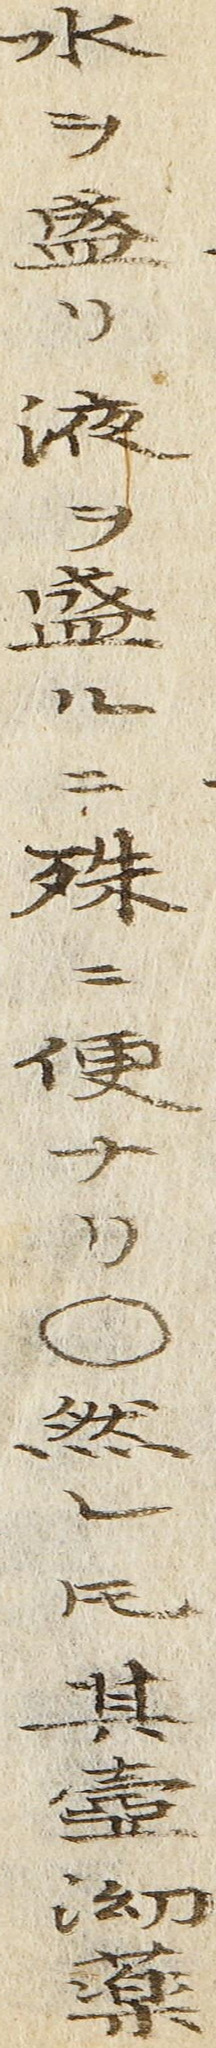水ヲ盛リ液ヲ盛ルニ殊ニ便ナリ◯然レトモ其壺泑薬
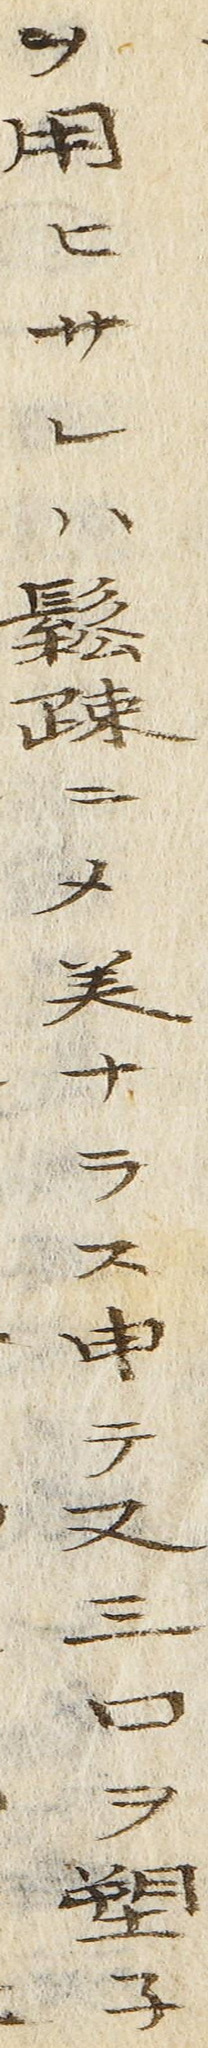ヲ用ヒサレハ鬆疎ニシテ美ナラス申テ又三口ヲ塑ネ
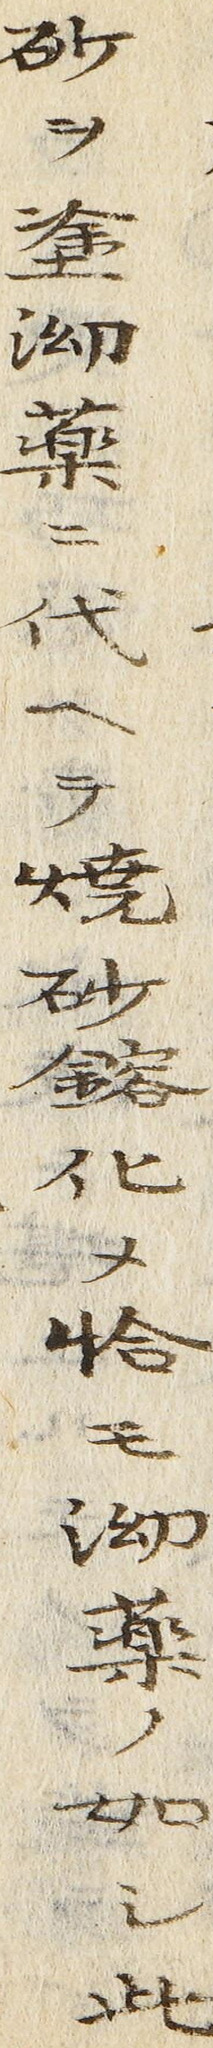砂ヲ塗泑薬ニ代ヘテ焼砂鎔化シテ恰モ泑薬ノ如シ此
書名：漂流紀事
